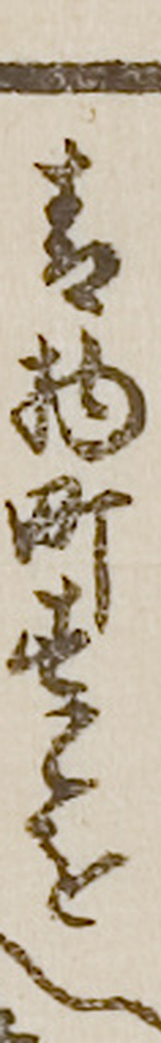青物町すとを
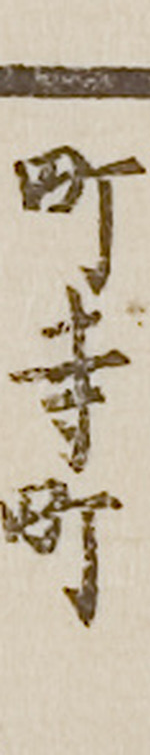町寺町
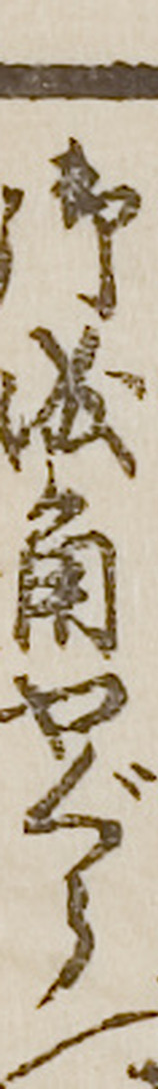御城角やぐら
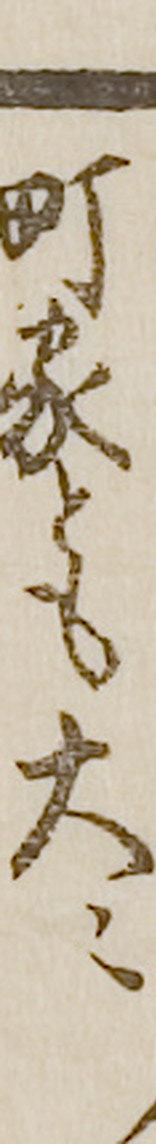町家とも大に
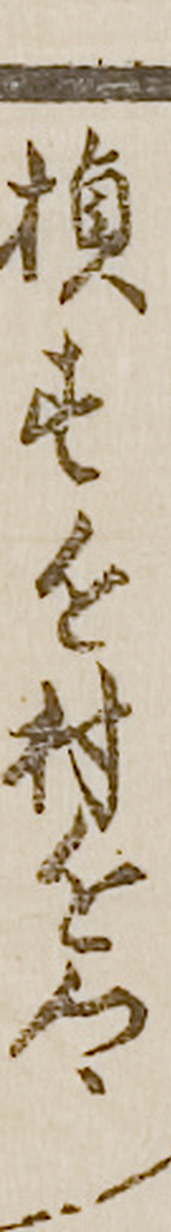損す近村近郷
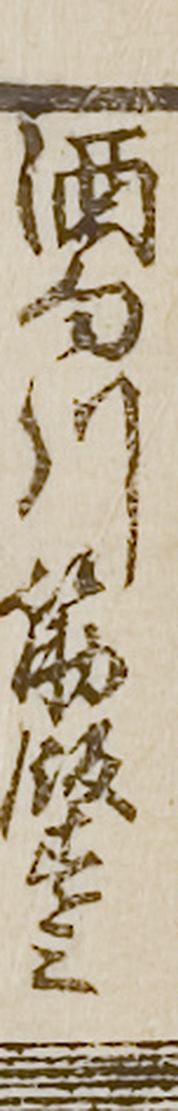酒匂川筋飯すみ
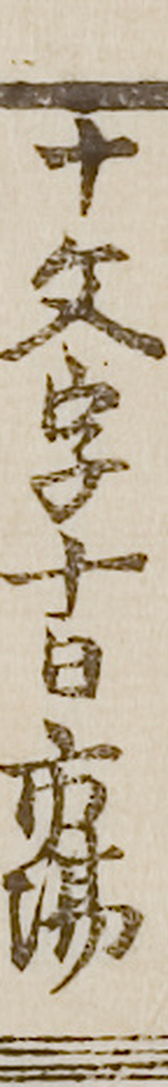十文字十日市場
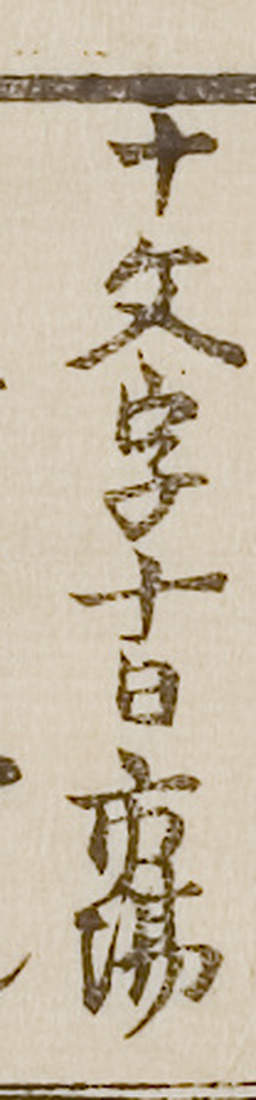十文字十日市場
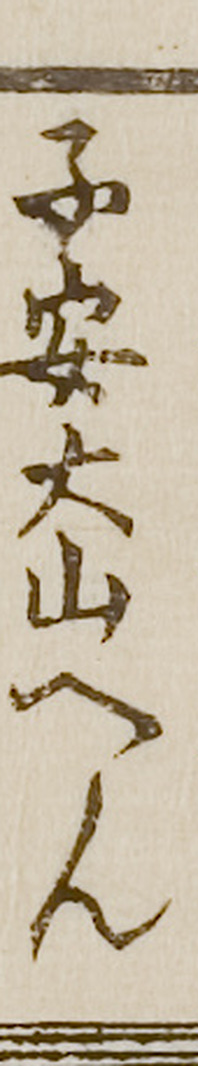子安大山へん
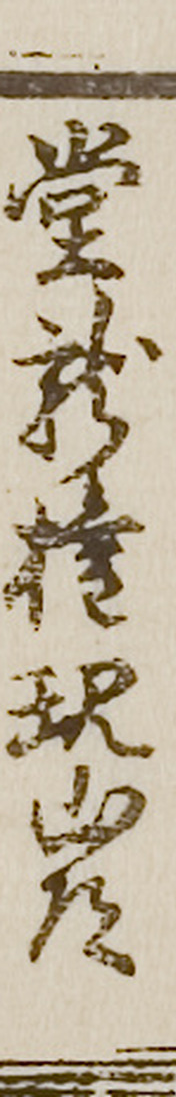堂龍権現山道
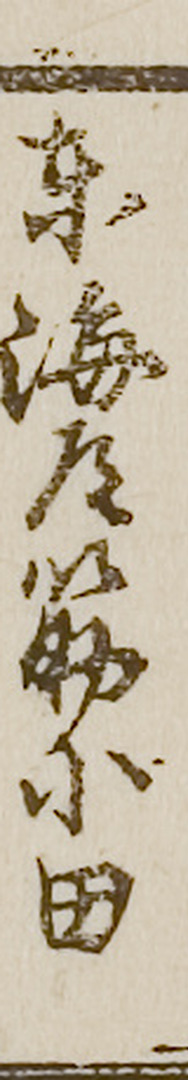東海道筋小田
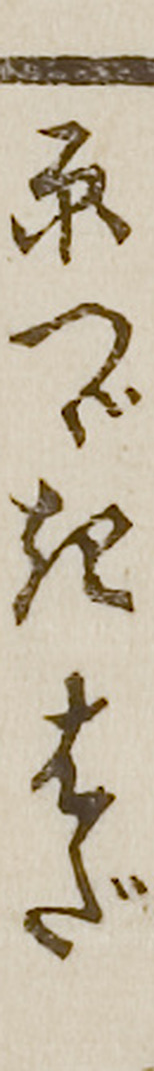原つゞきはだ
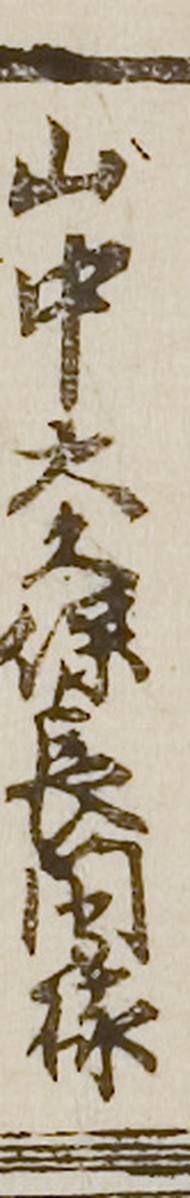山中大久保長門守様
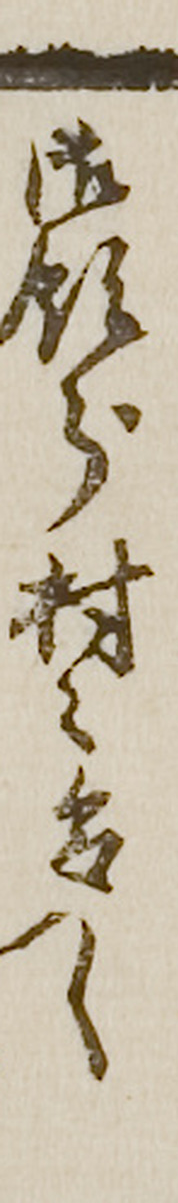御領分村々多く
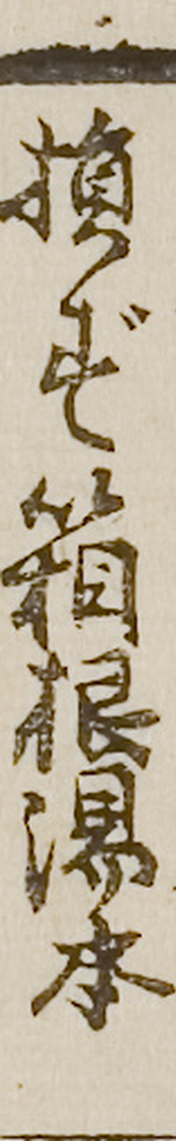損ず箱根湯本
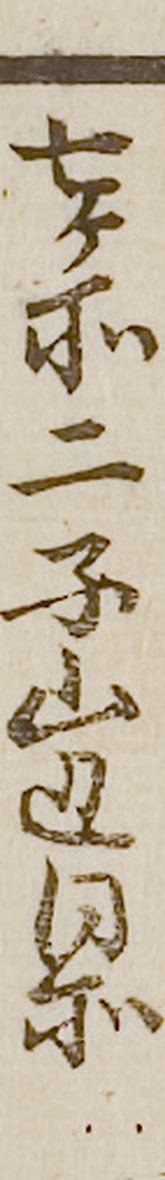七ケ所二子山辺同所
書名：[嘉永六丑年二月二日相州地震]
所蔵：東京大学総合図書館 General Library in the University of Tokyo, JAPAN
